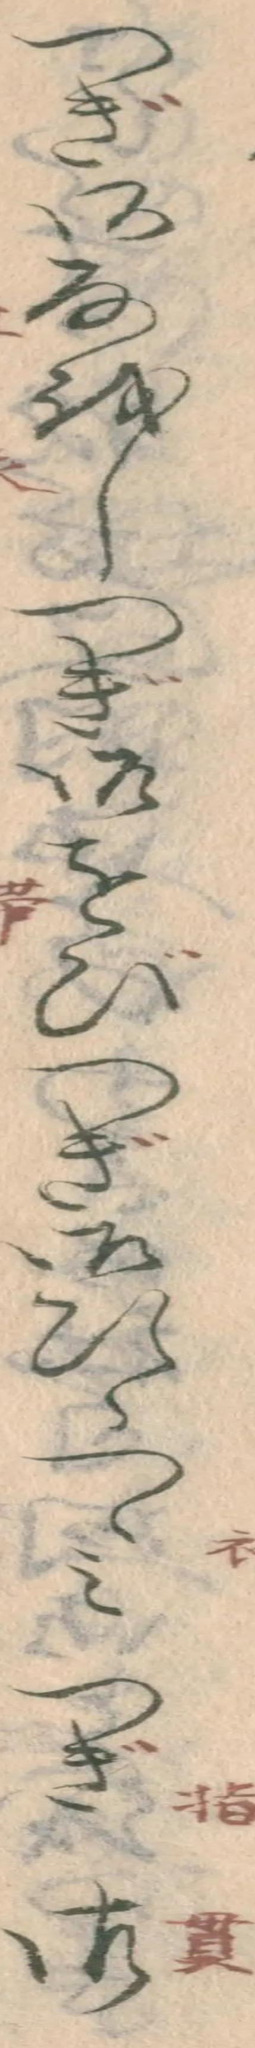つぎ御なをしつぎ御をびつぎ御ひらつゝみつぎ御
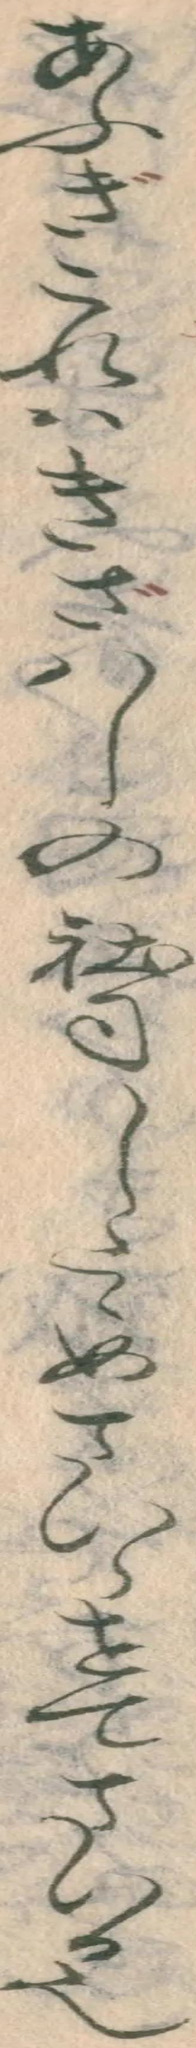あふぎこれはきざはしの社司したゝめまひらせてまいる也
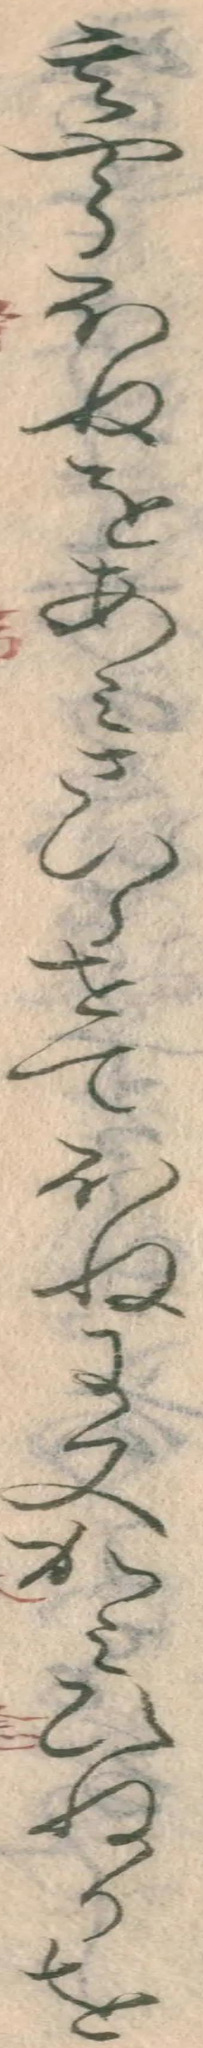其やうほねをあみまいらせてほねに又かみひねりを
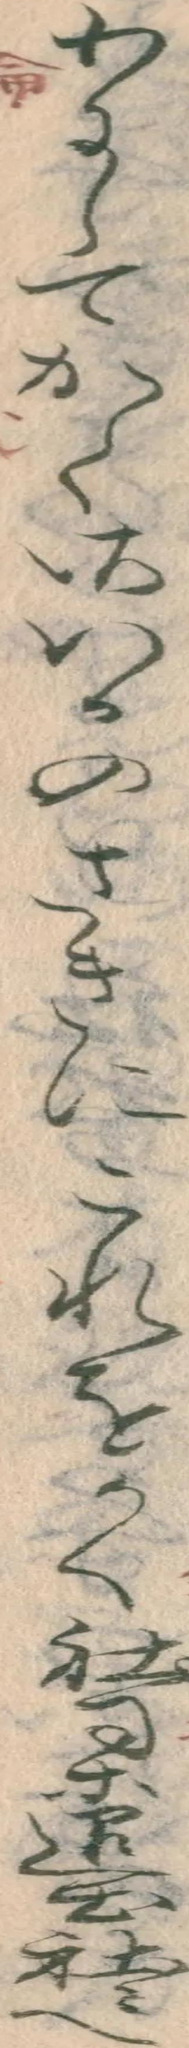わにしてかく御いかのさきにこれをかく社司等退出社々へ
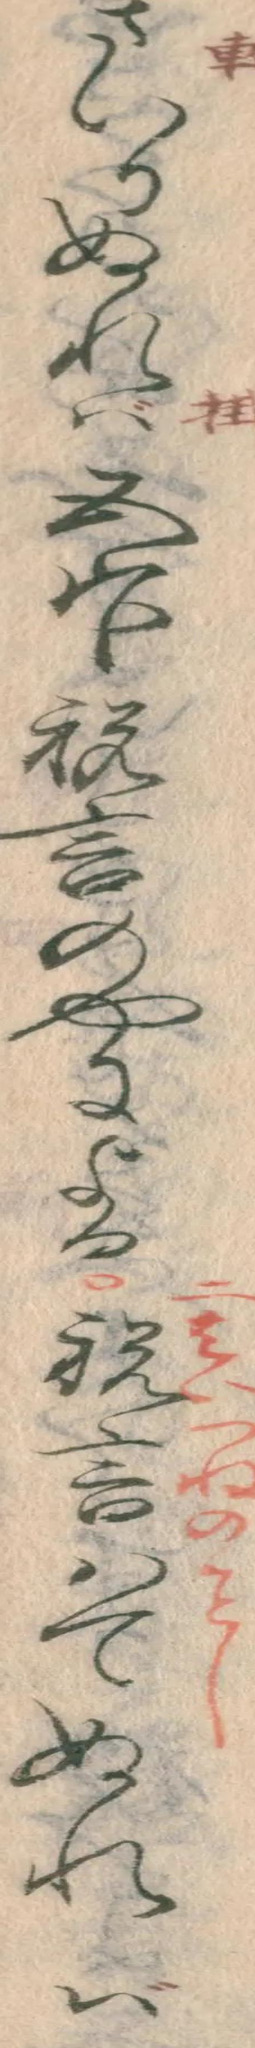まいりぬれば五官祝言のやによる◦祝言はてぬれば
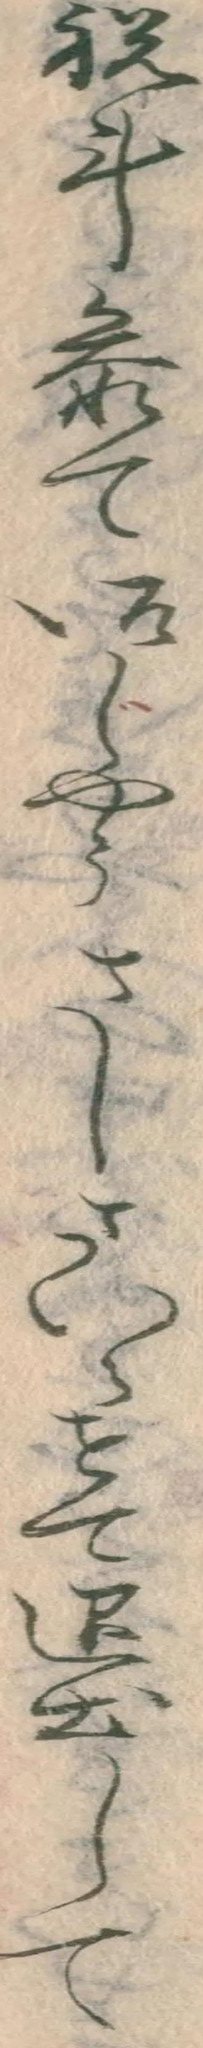祝計参て御じやうさしまいらせて退出して
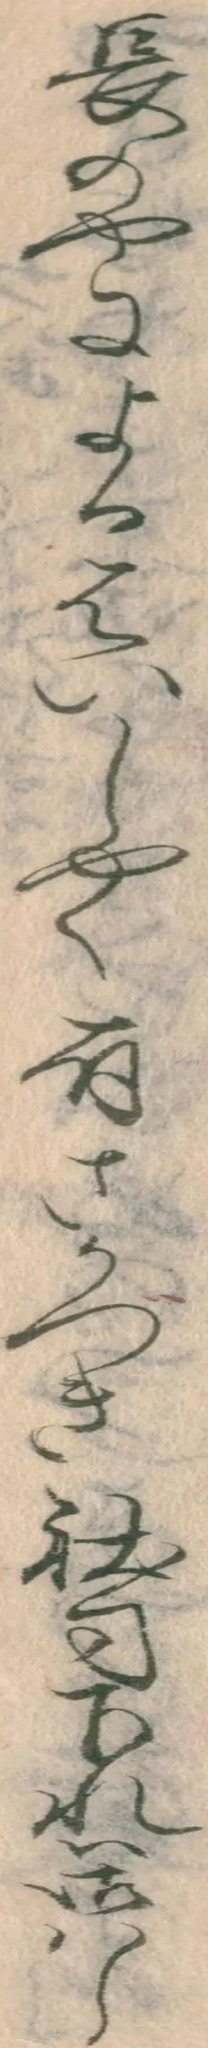長のやによるはいしやく有さかづき社司下れは御はし
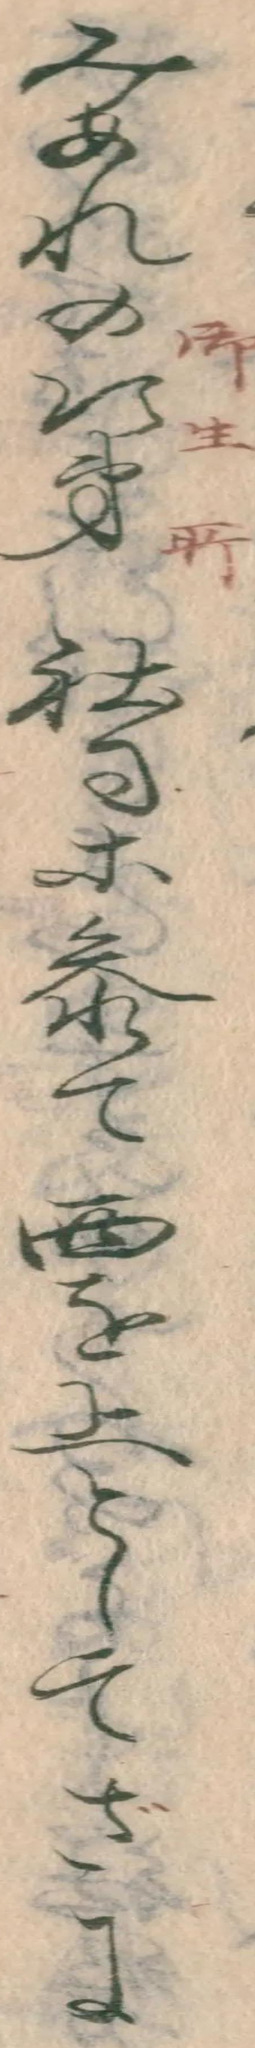一みあれの次第社司等参て西を上としてざに
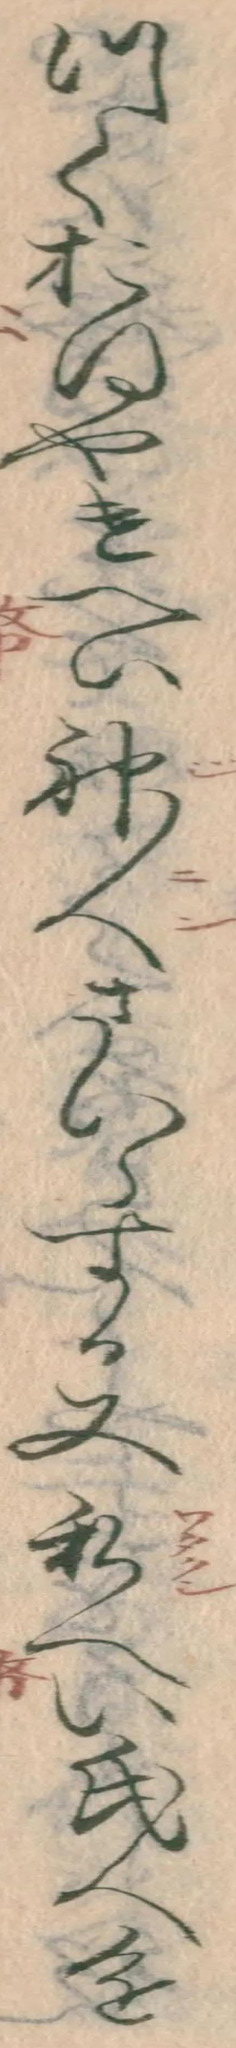つくおほやけへい神人まいらする又私へい氏人進
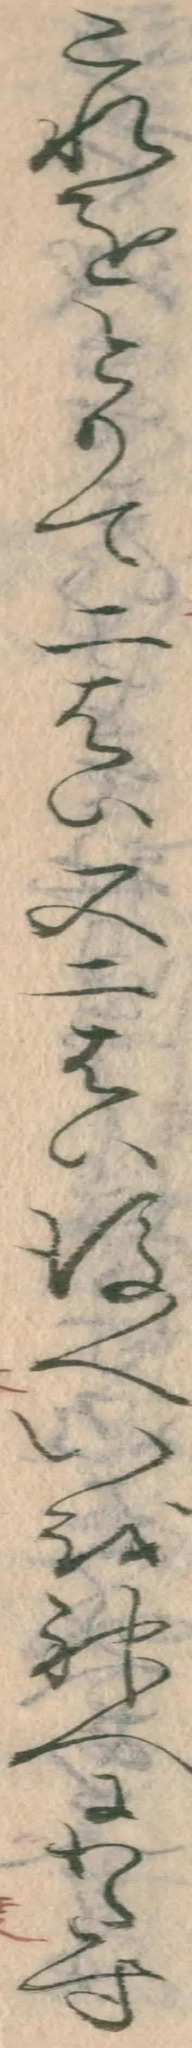これをとりて二はい又二はい後へいを神人にわたす
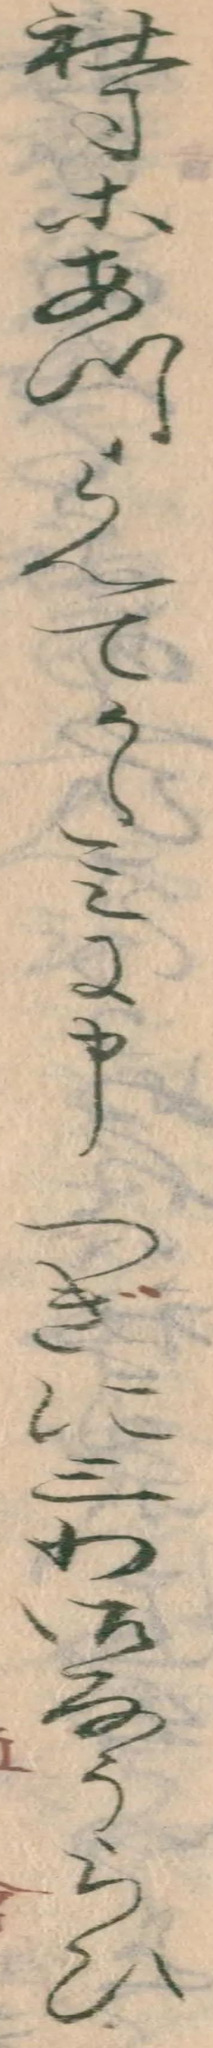社司等あつらんてかたみに申つぎに三わ御なうらひ
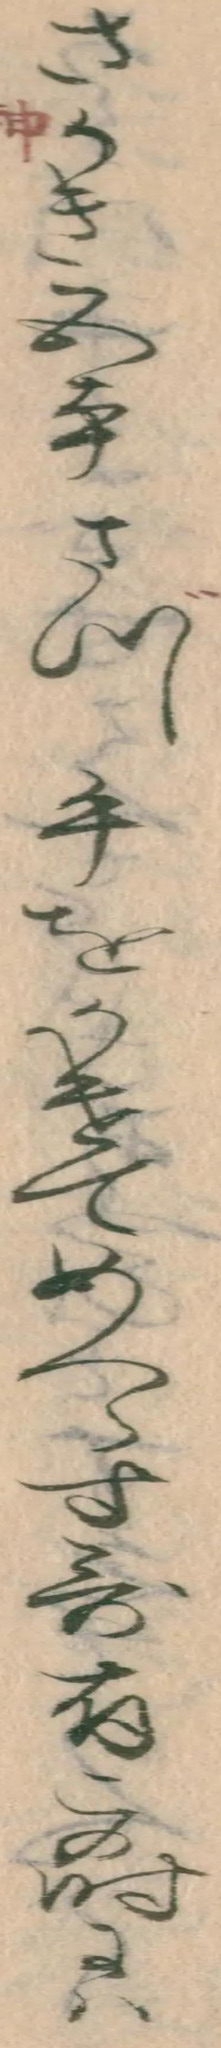さかき五本まづ手をかけてめくらす哥有この時には
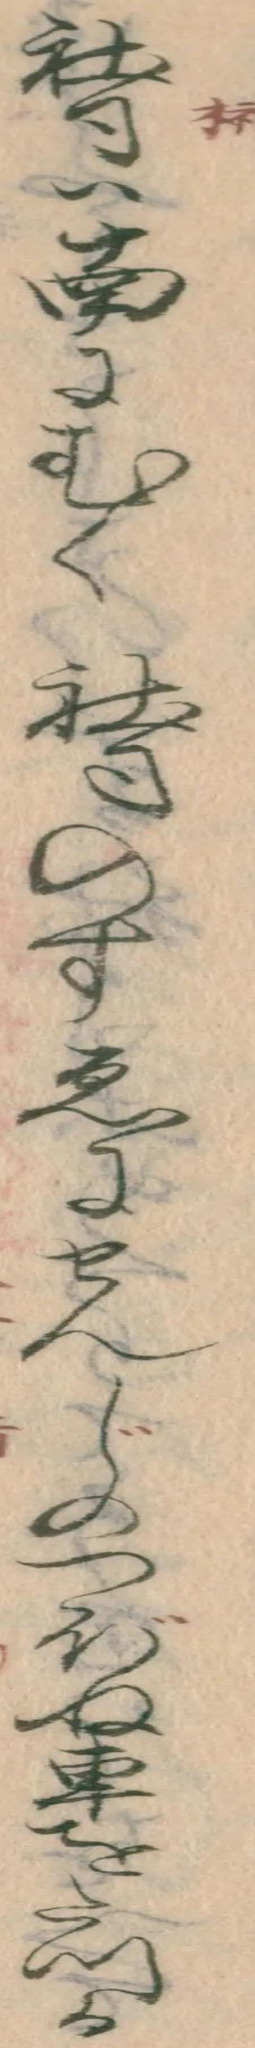社司は南にむく社司のすゑにせんじのつぼね車をたつる
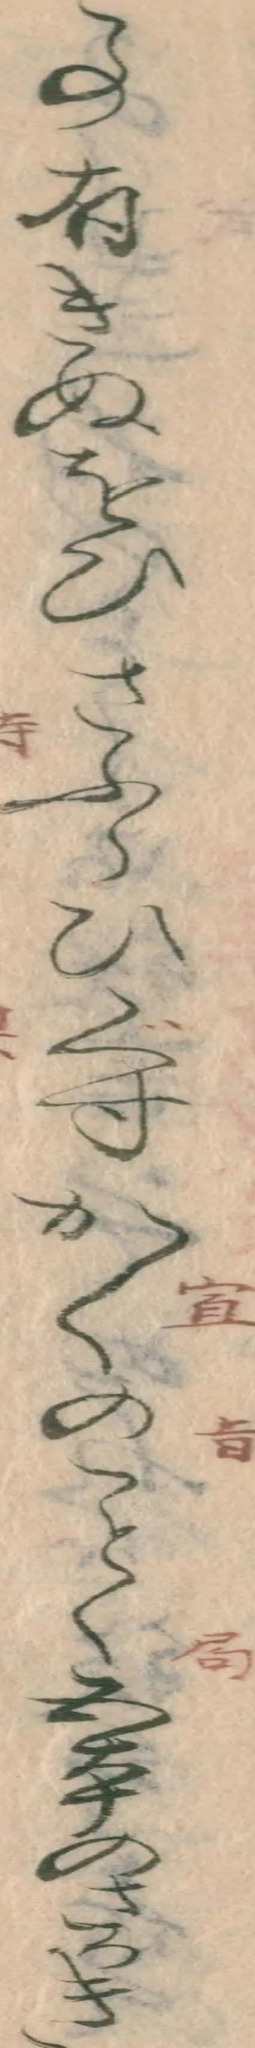事有きぬをひさふらひぐすかくのことく五本のさかき
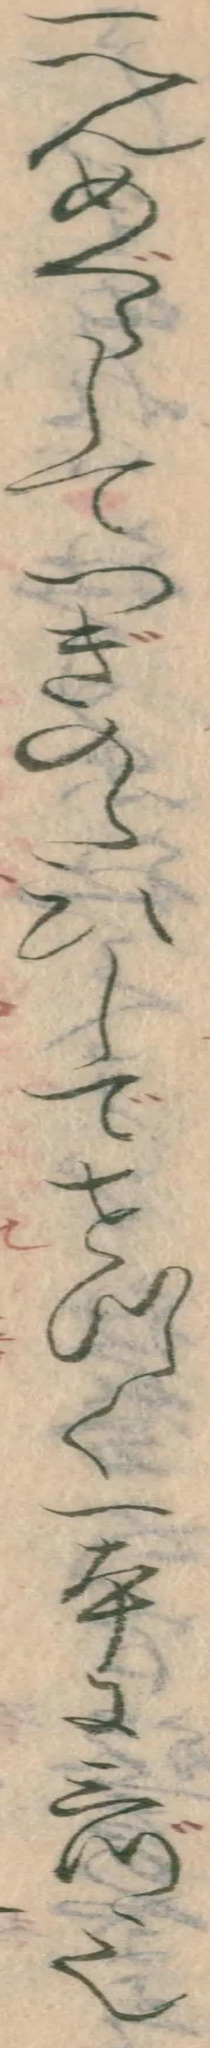一へんめぐらしてつぎのたひしでせつく一本に三づゝ也
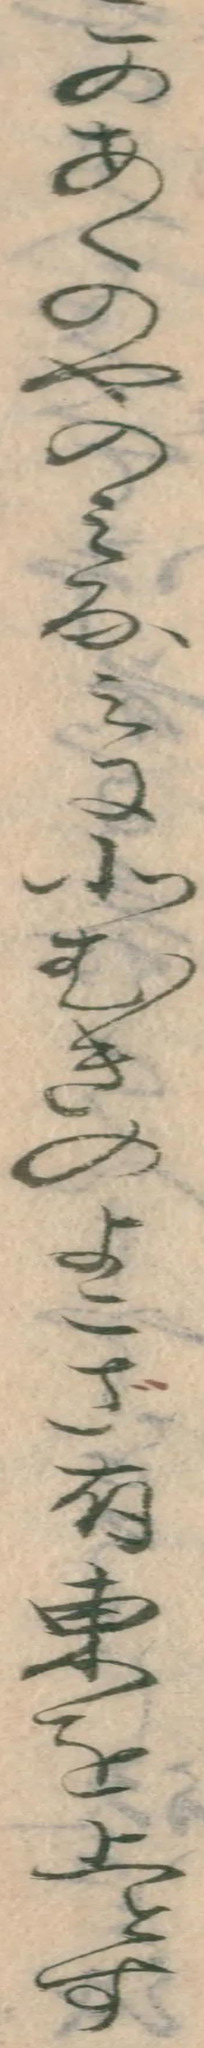このあくのやのみなみに北むきのよこざ有東を上とす
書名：賀茂社記録. 第3冊
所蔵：国立国会図書館 National Diet Library, JAPAN
